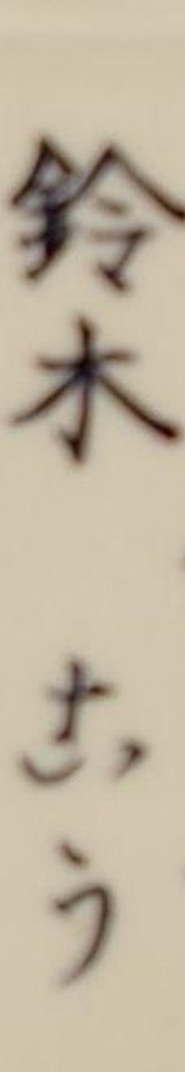鈴木こう
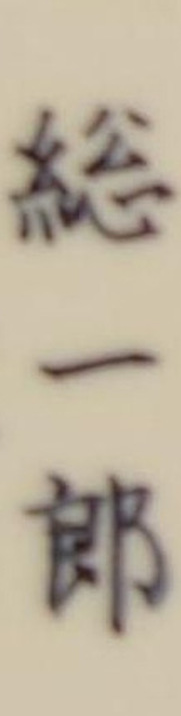総一郎

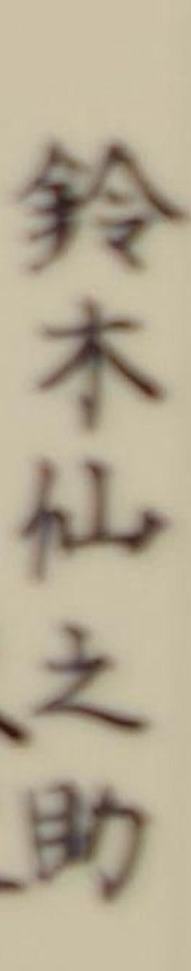鈴木仙之助
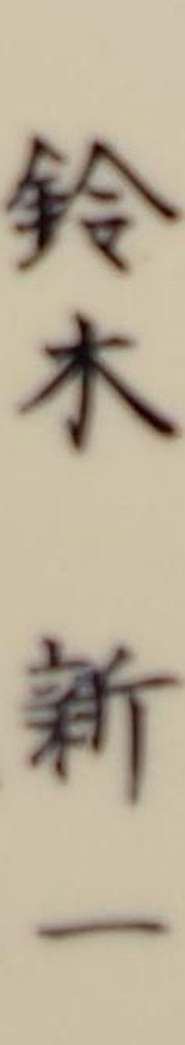鈴木新一
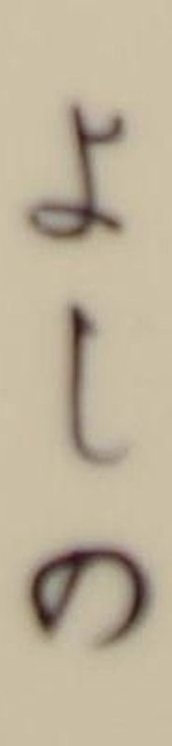よしの
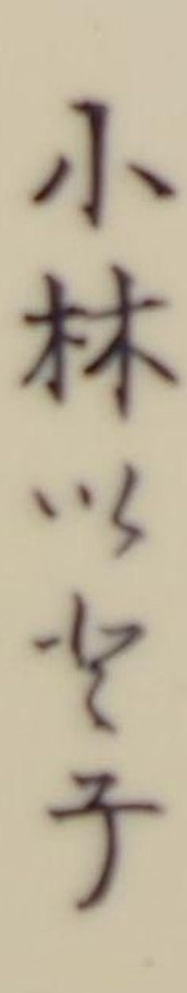小林いと子
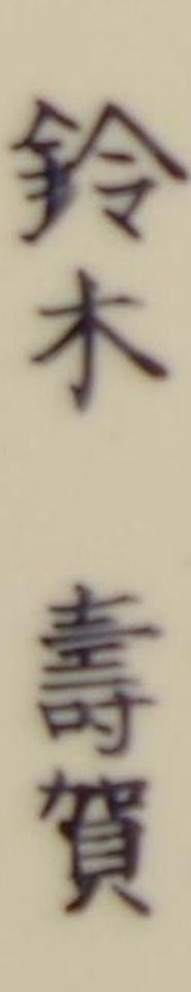鈴木壽賀
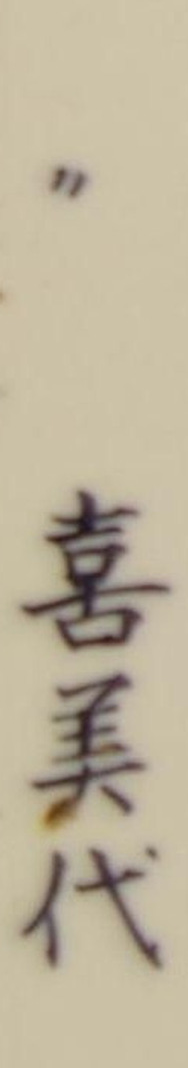喜美代
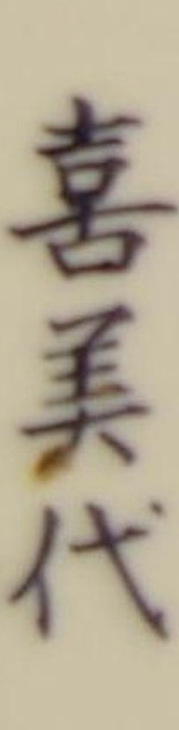喜美代

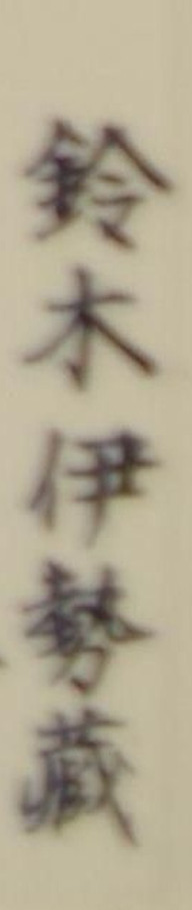鈴木伊勢蔵
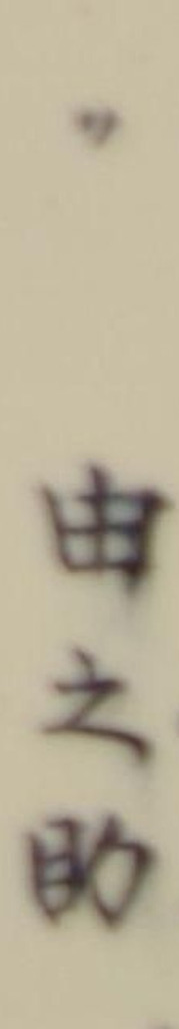由之助
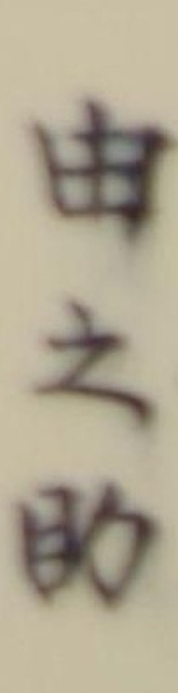由之助
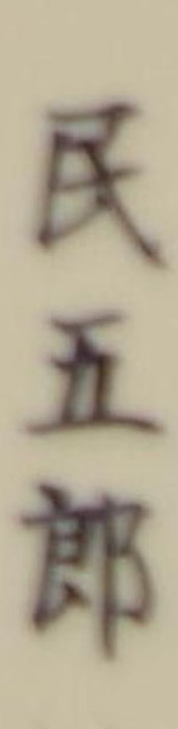民五郎
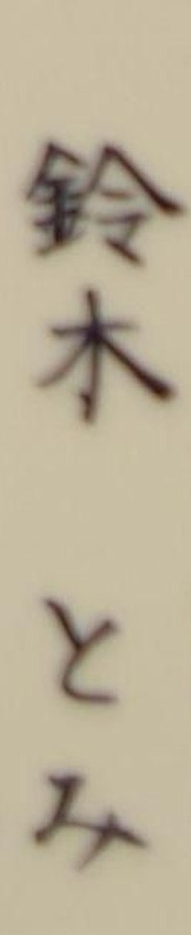鈴木とみ
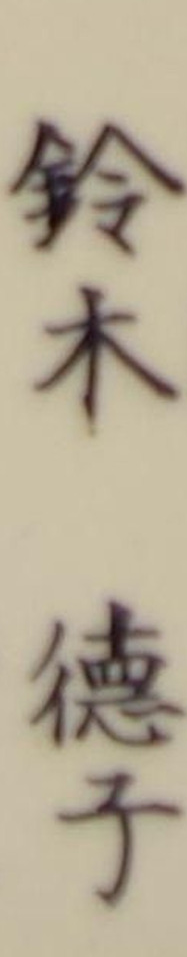鈴木徳子
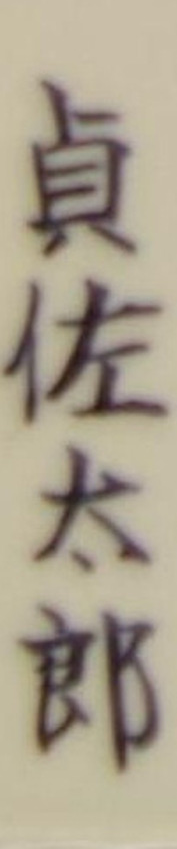貞佐太郎
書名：A~D
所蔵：koyasan kongobuji
